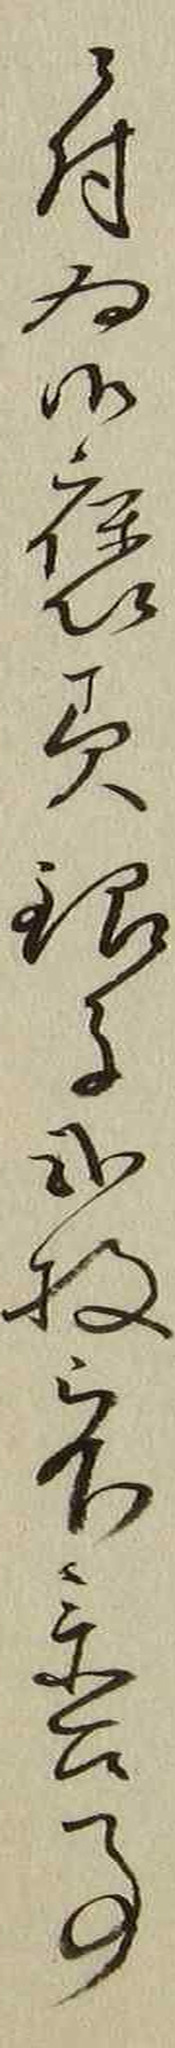ニ付為御褒美銀子弐枚被下置候事
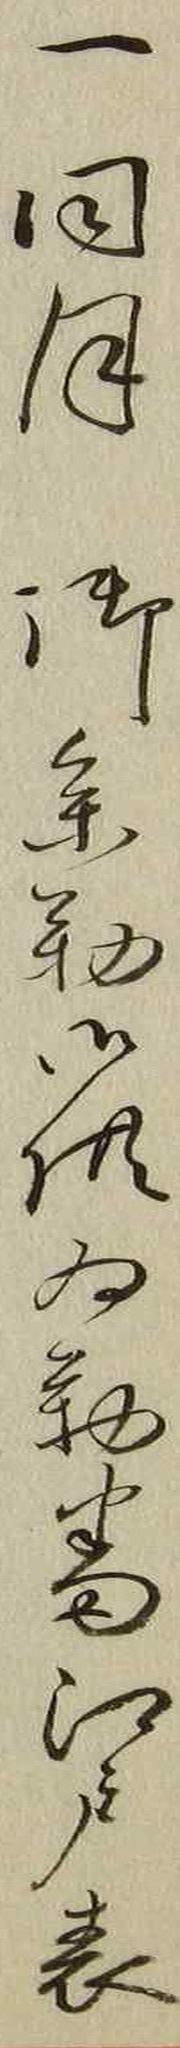一同月御参勤御供為勤番江戸表
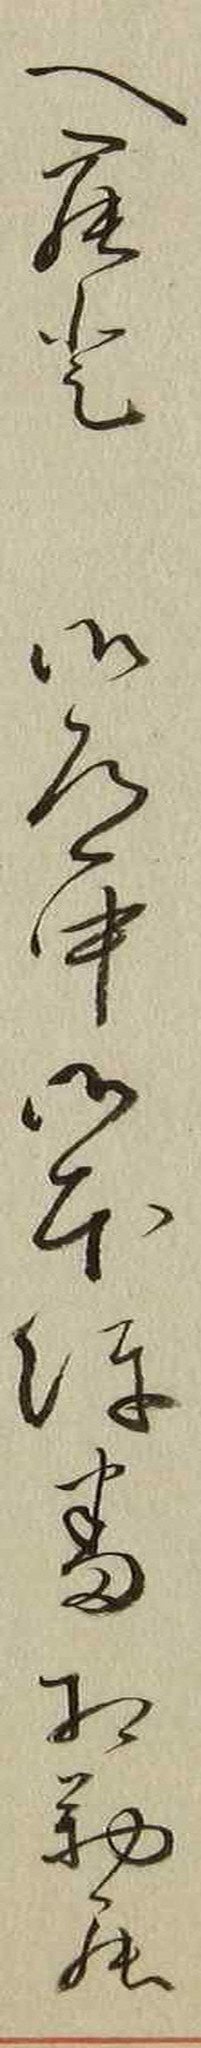へ罷登御道中御本陣番相勤罷
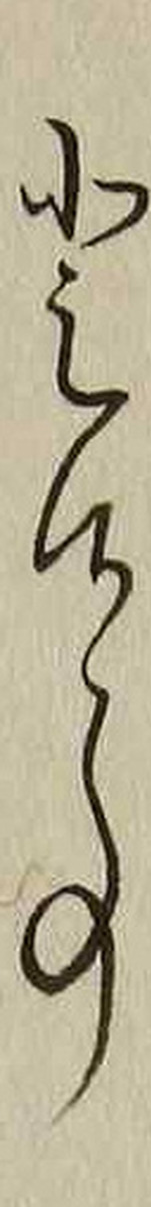登候事
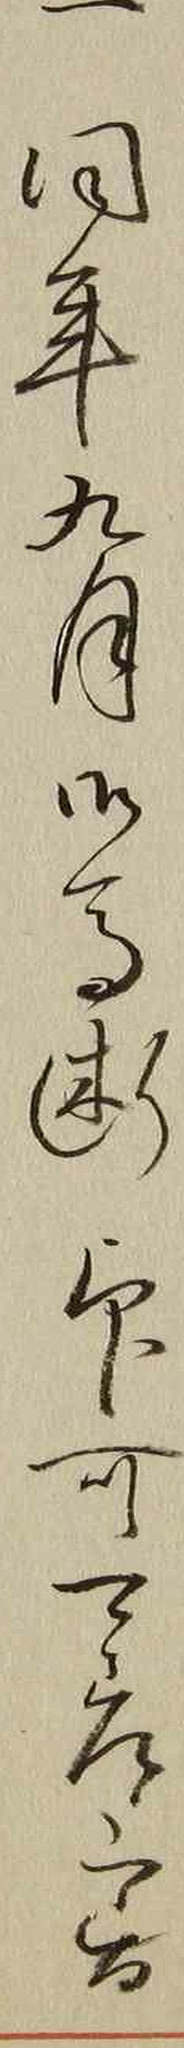一同年九月御馬術印可可差上旨
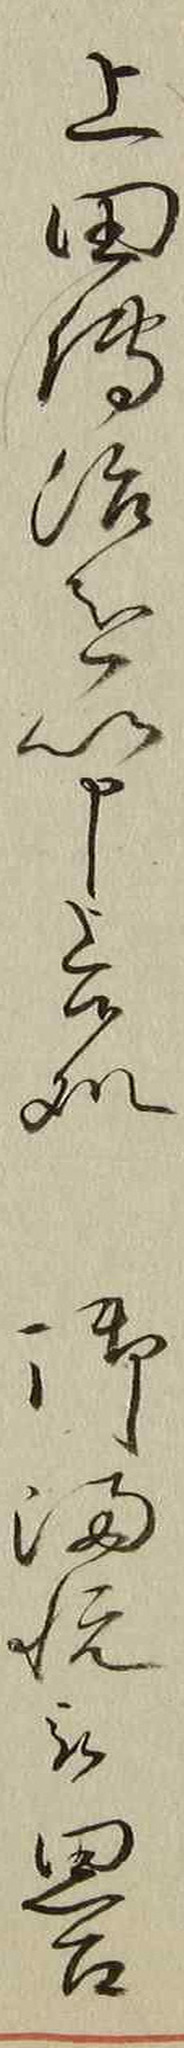上田伝治を以申上候処御満悦被思召
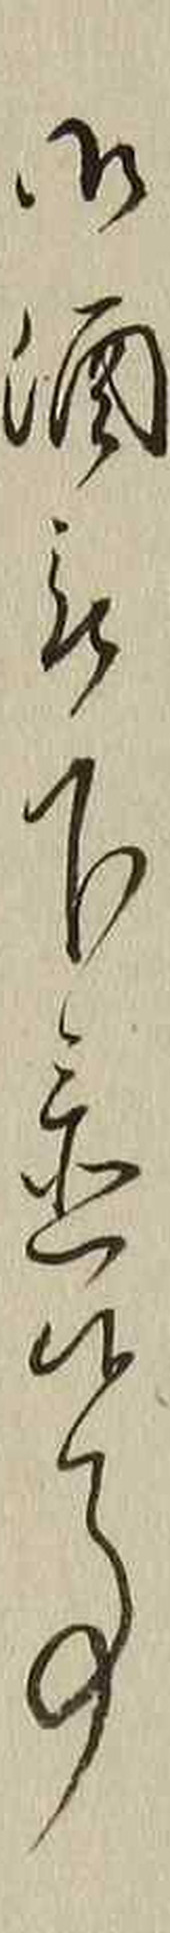御酒被下置候事
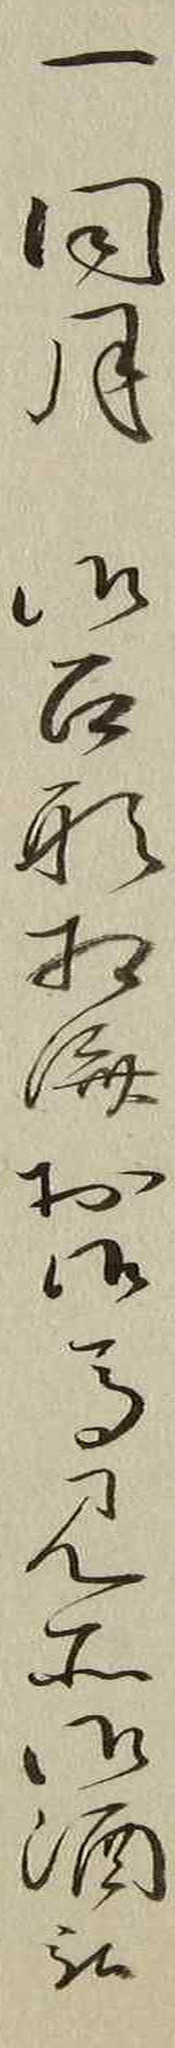一同月御召形相済於御馬見所御酒被
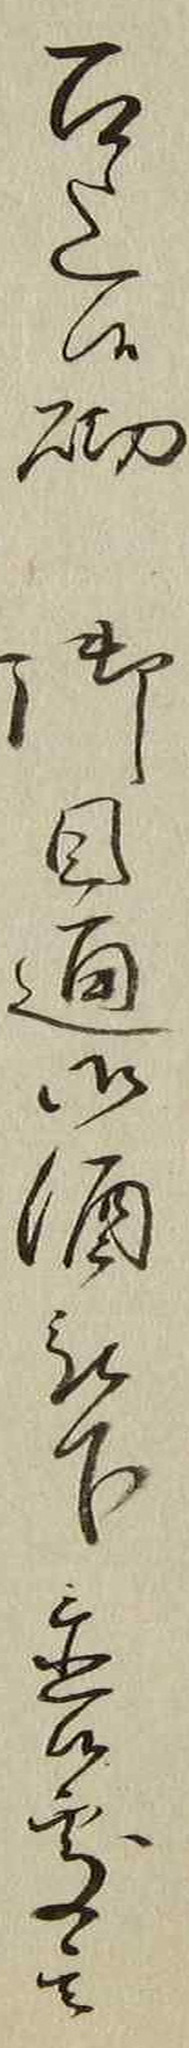召上候砌御目通御酒被下置候處其
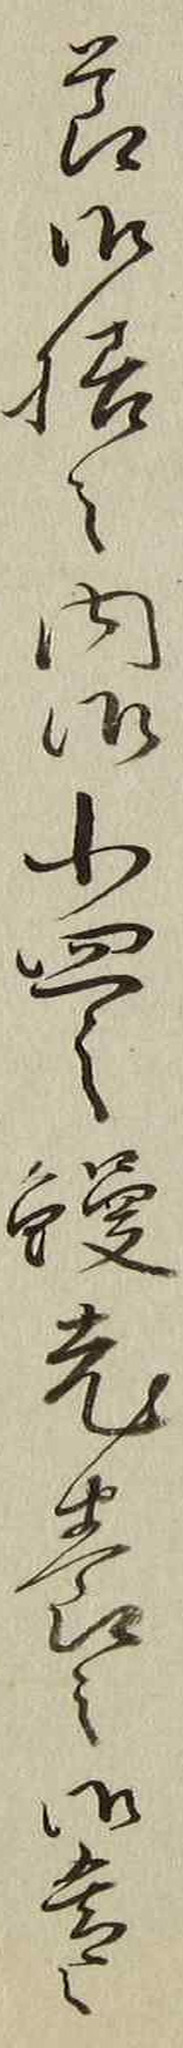節御膳之内御小皿之鰻老養之御肴之
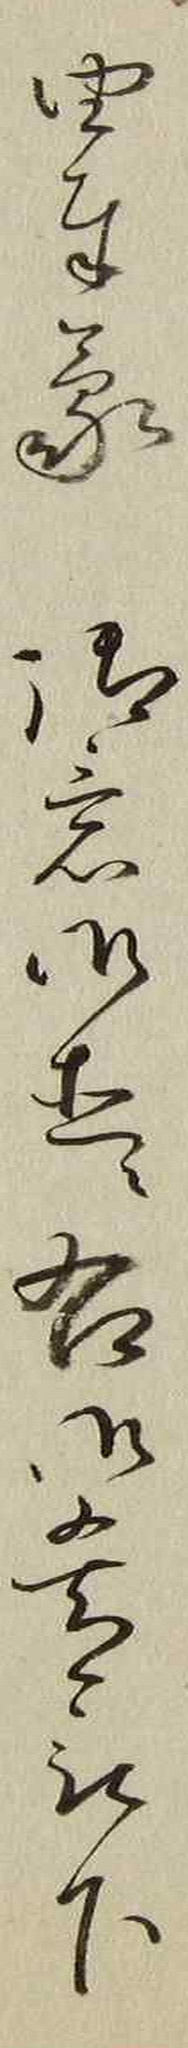由奉蒙御意御直ニ右御肴被下
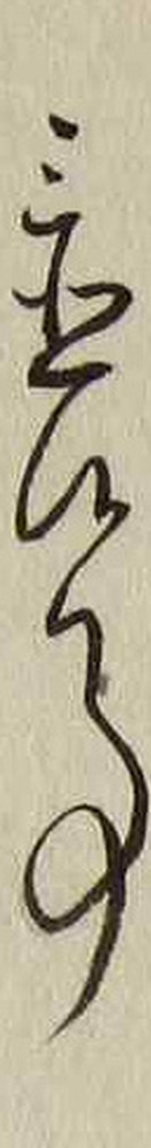置候事
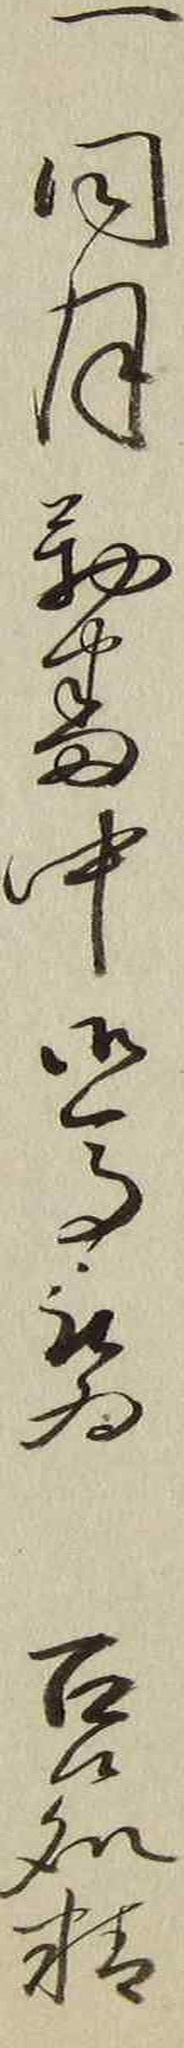一同月勤番中御馬被為召候処精
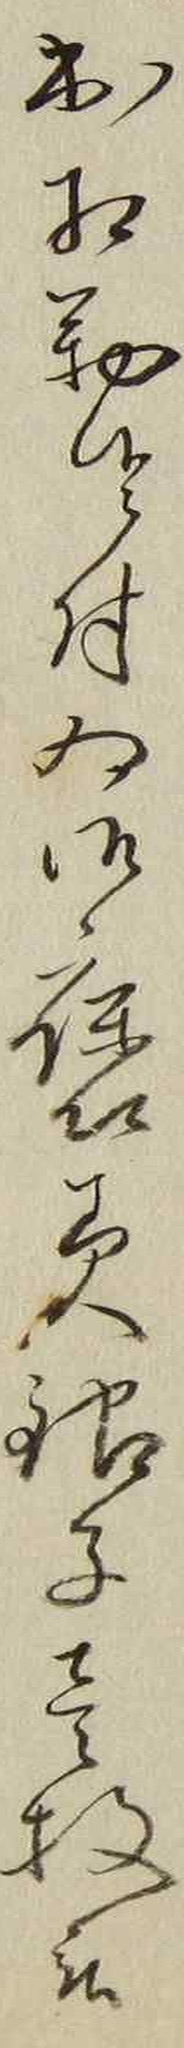出相勤候ニ付為御褒美銀子壱枚被
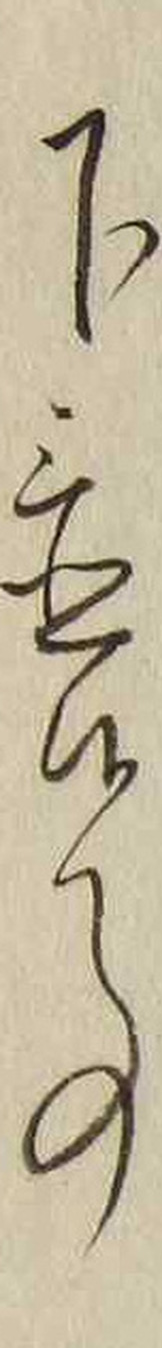下置候事

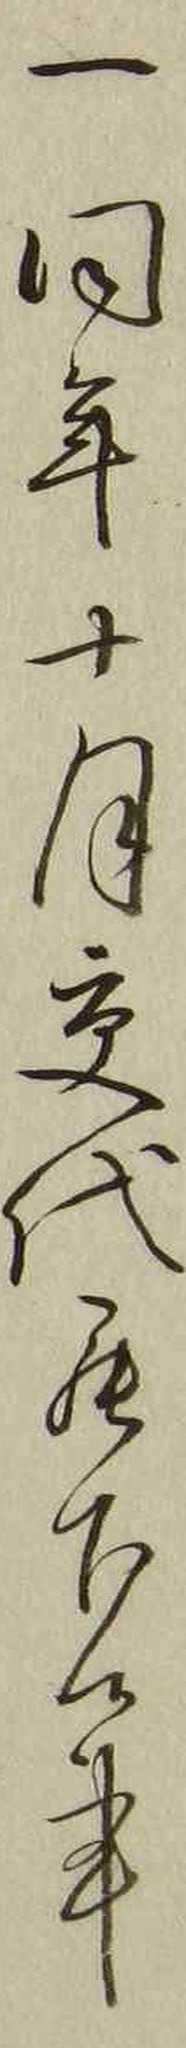一同年十月交代ま罷下候事
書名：諸士系譜　巻之3　い之部3
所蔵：会津若松市立会津図書館
